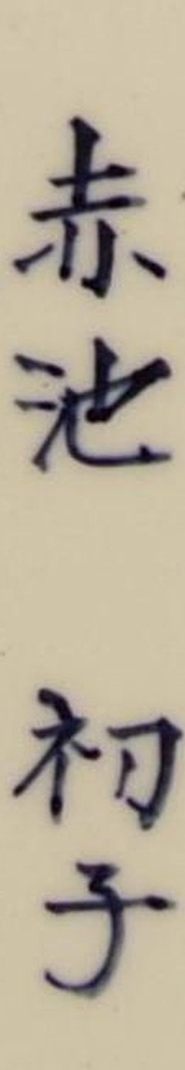赤池初子
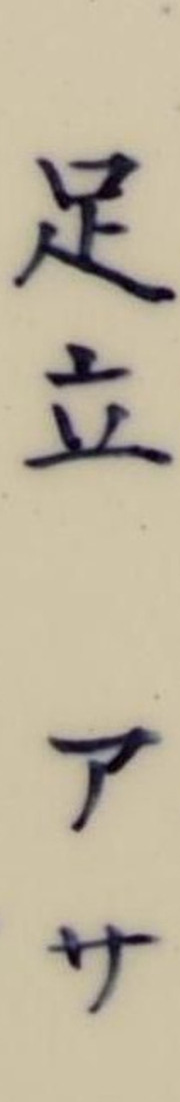足立アサ
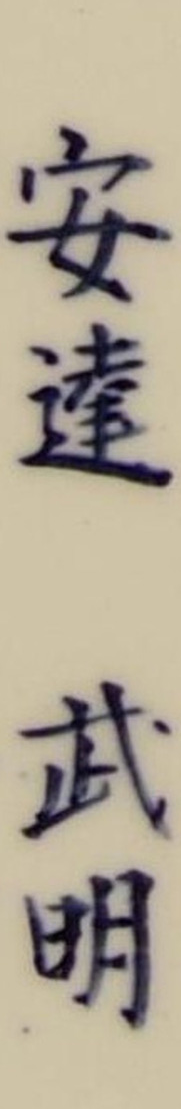安達武明
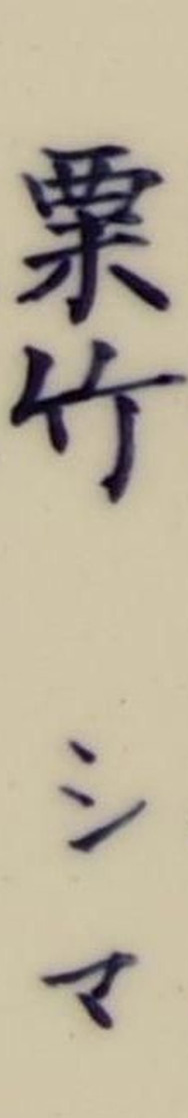栗竹シマ
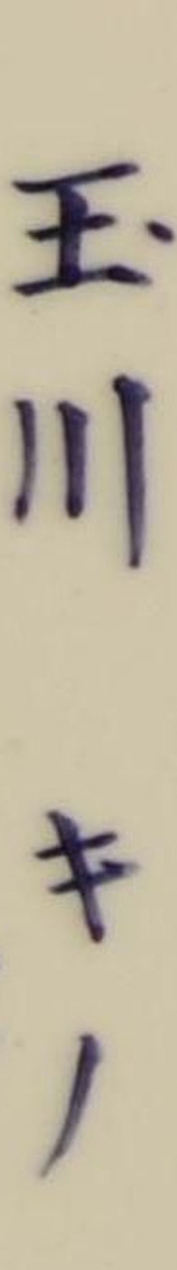玉川キノ

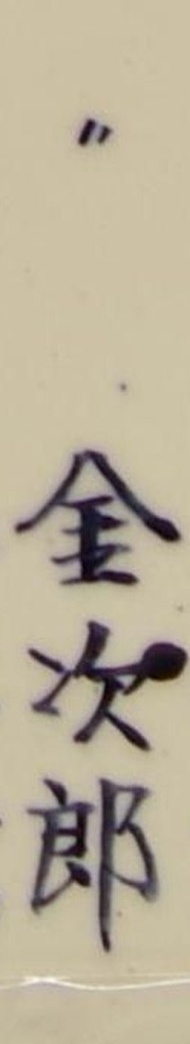金次郎
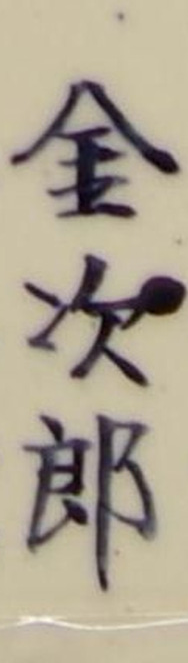金次郎
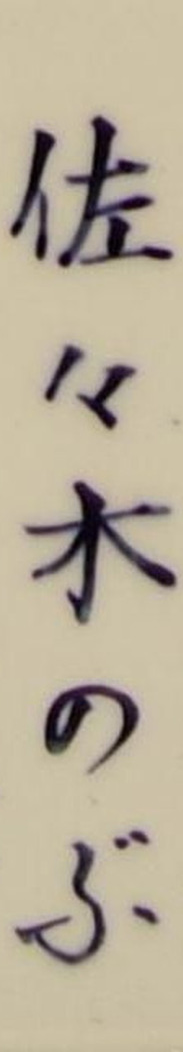佐々木のぶ
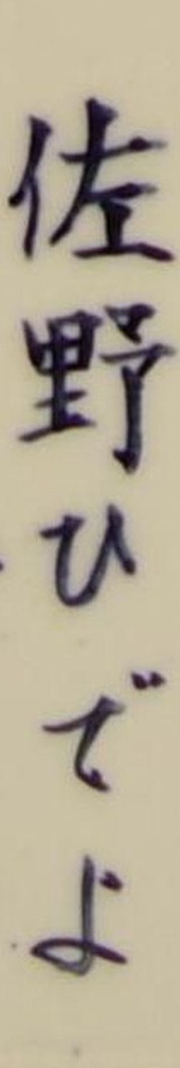佐野ひでよ
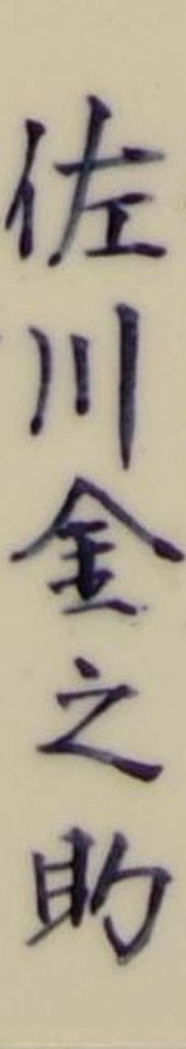佐川金之助

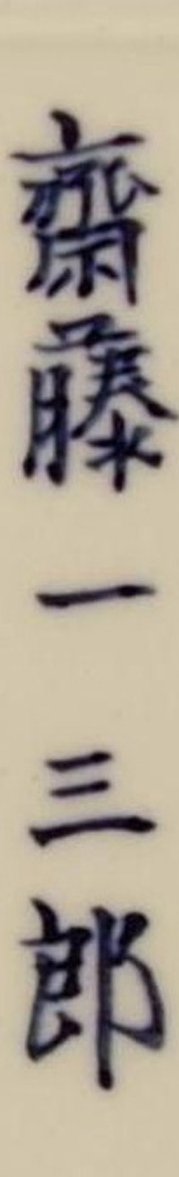斎藤一三郎
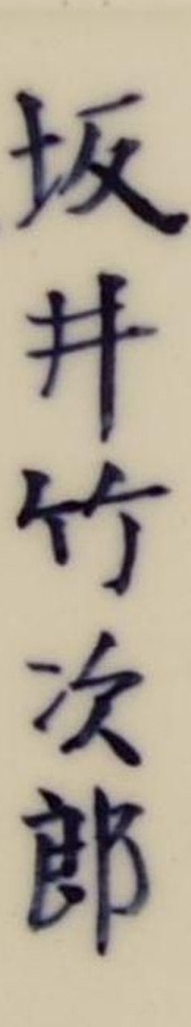坂井竹次郎
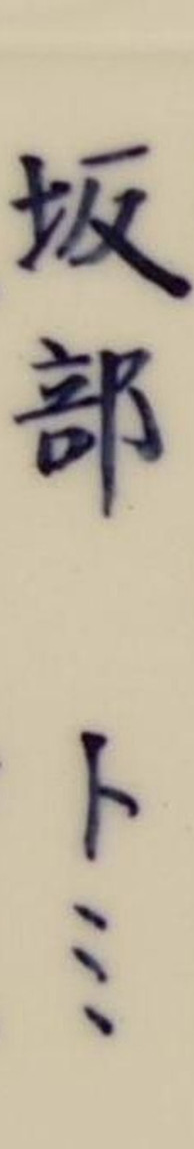坂部トミ
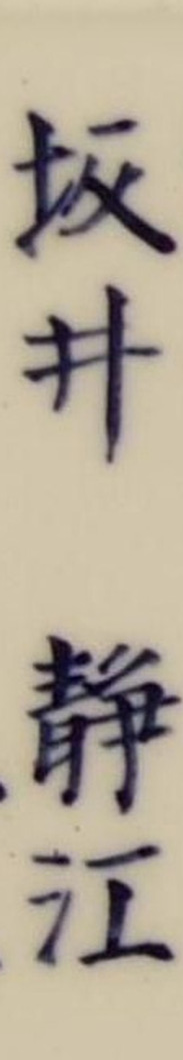坂井静江
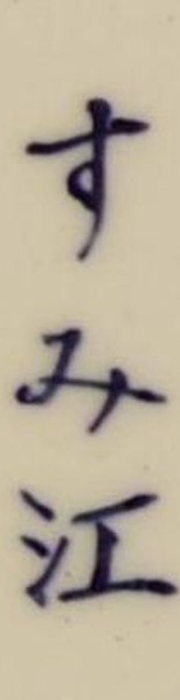すみ江
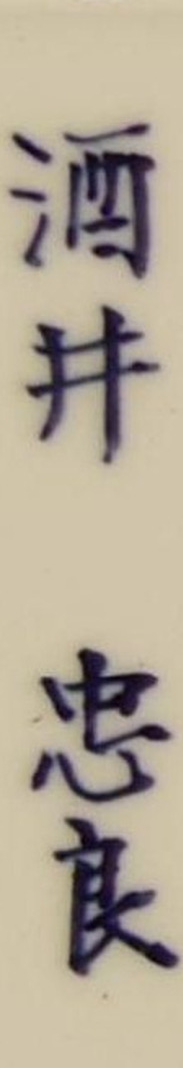酒井忠良
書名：E~L
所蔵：高野山金剛峯寺
